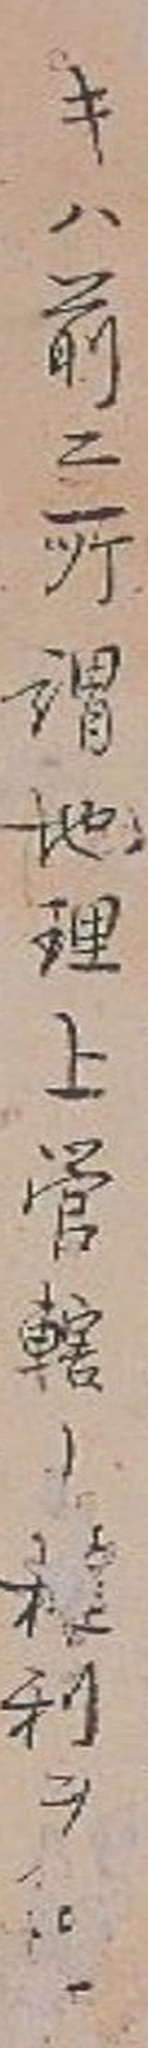キハ前ニ所謂地理上管轄ノ権利ヲ
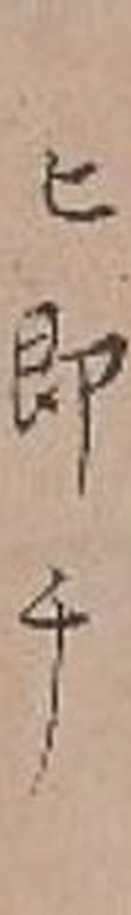ヒ即チ
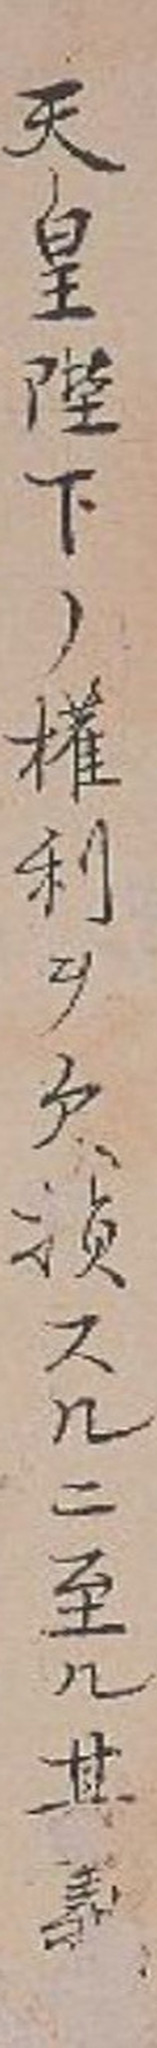天皇陛下ノ権利ヲ欠損スルニ至ル其義
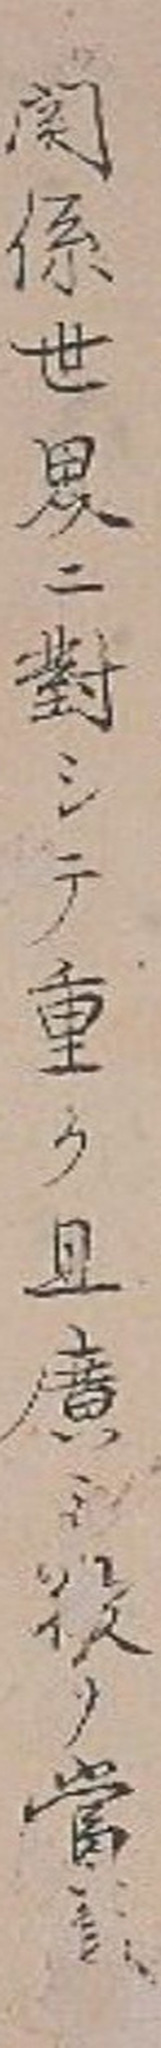関係世界ニ対シテ重ク且広役ノ当
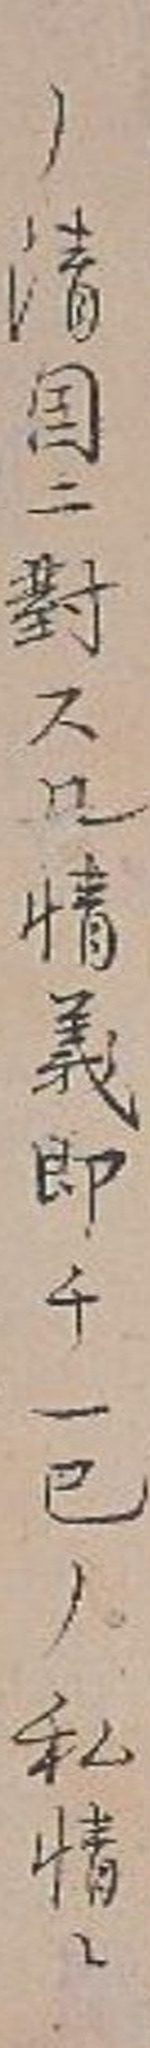ノ清国ニ対スル情義即チ一己ノ私情
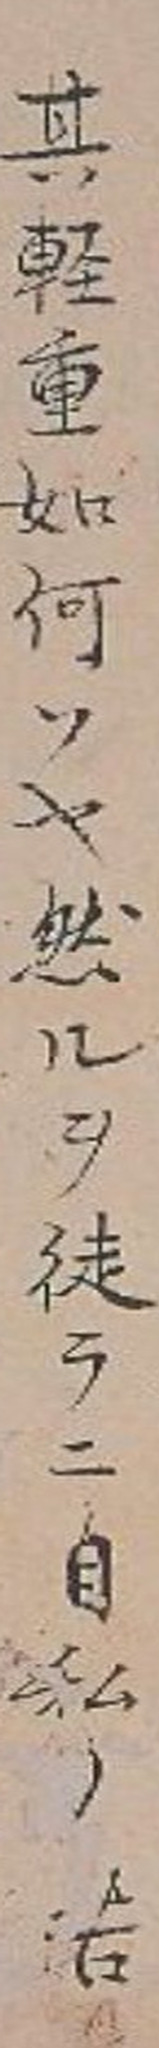其軽重如何ソヤ然ルヲ徒ラニ自私ノ若
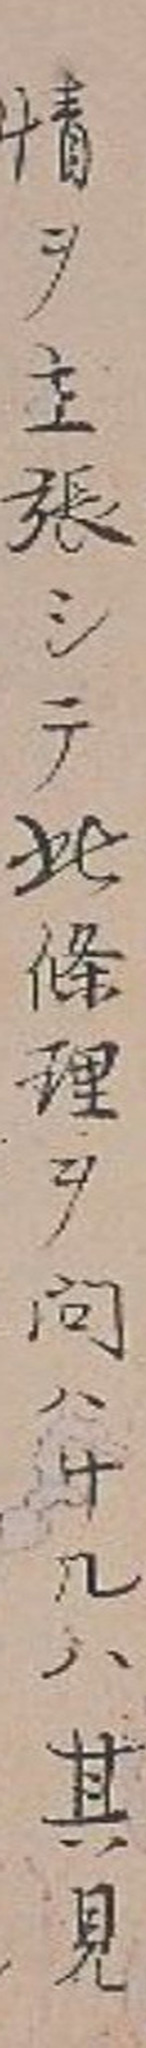情ヲ主張シテ此条理ヲ問ハサルハ其見
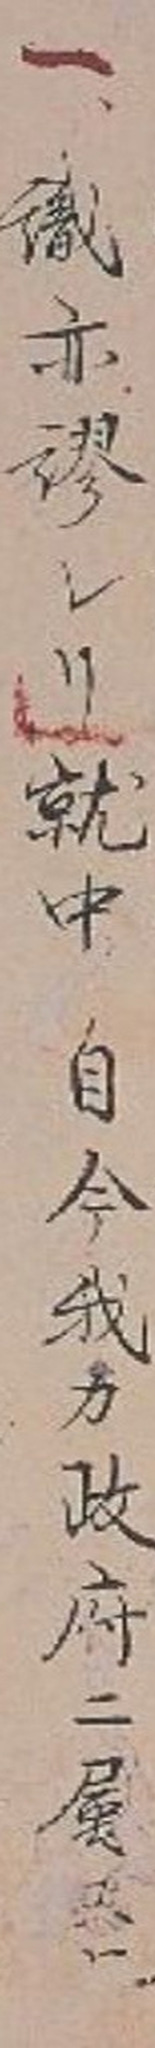一、識亦謬レリ」就中自今我カ政府ニ属
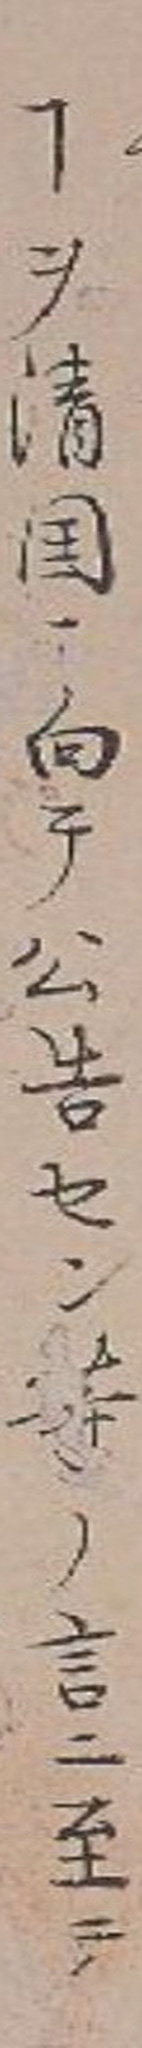コトヲ清国ニ向テ公告セン等ノ言ニ至テ
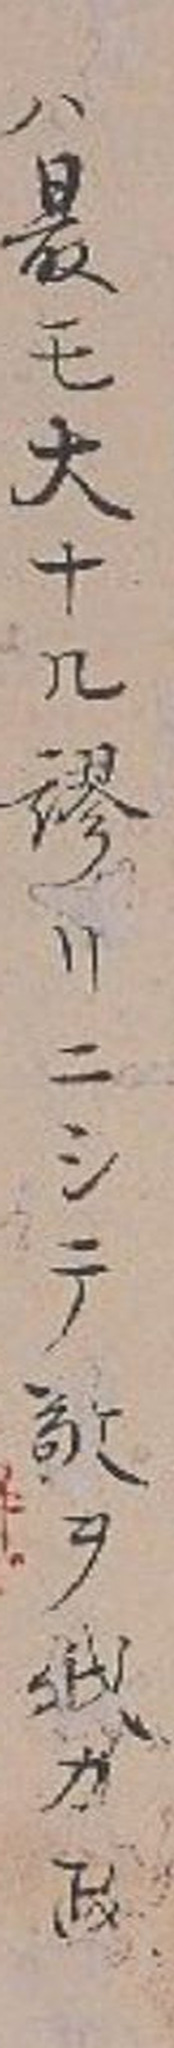ハ最モ大ナル謬リニシテ敬ヲ我カ政
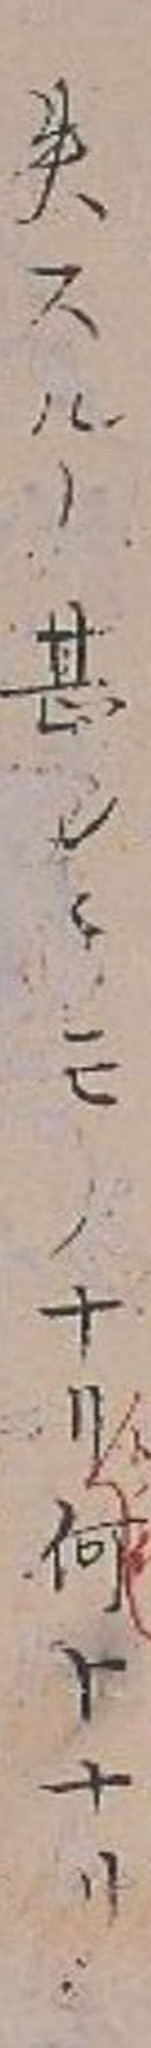失スルノ甚シキモノナリ何トナリ

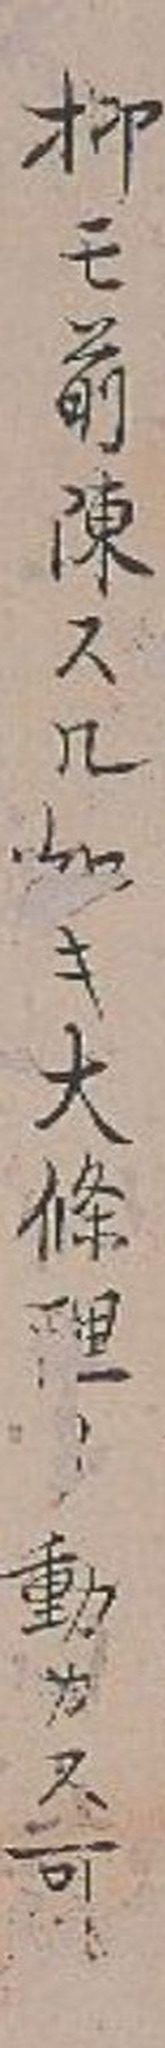抑モ全陳スル如キ大条理ノ動カス可
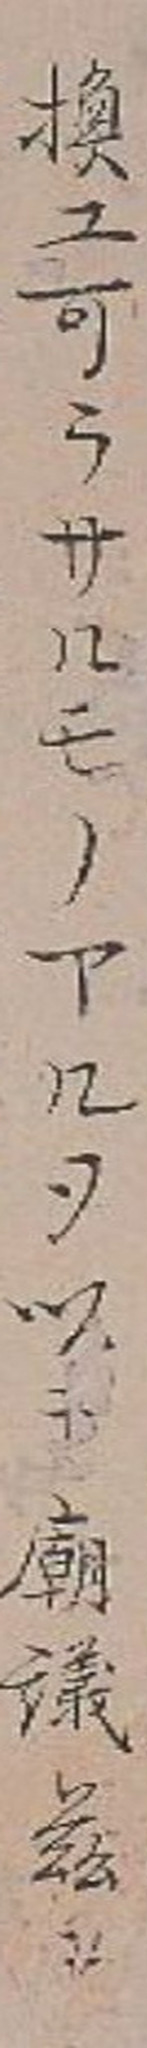換ユ可ラサルモノアルヲ以テ廟議茲
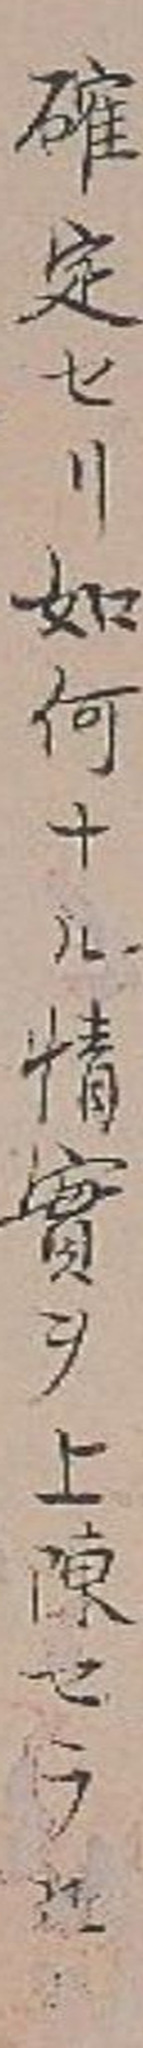確定セリ如何ナル情実ヲ上陳セラル
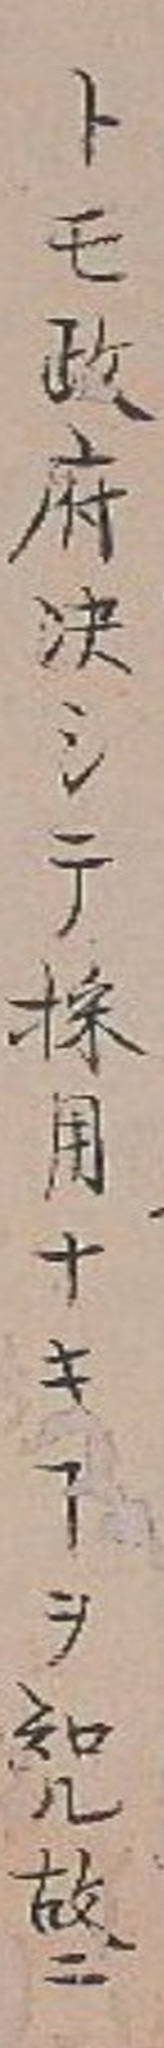トモ政府決シテ採用ナキコトヲ知ル故ニ
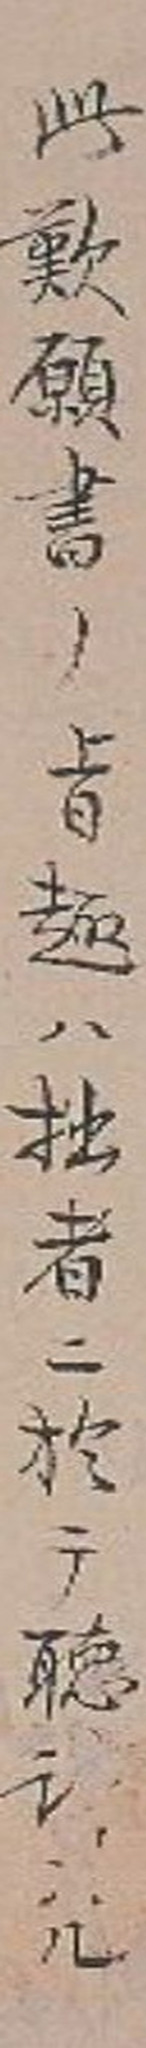此歎願書ノ旨趣ハ拙者ニ於テ聴許スル
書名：奉使琉球始末 草稿之一部
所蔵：University of the Ryukyus Library
